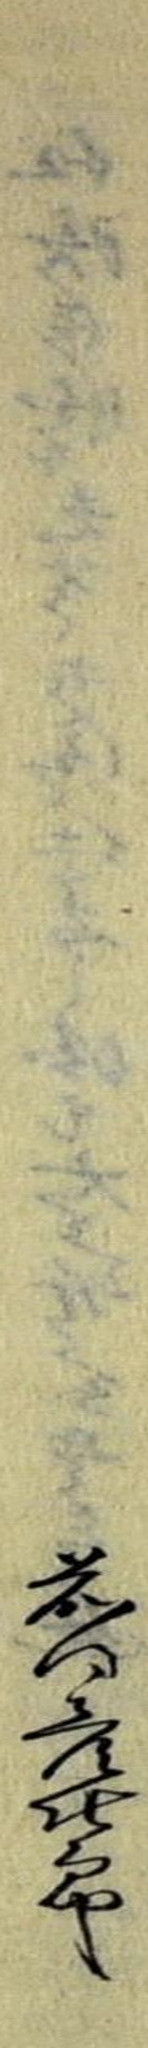前田彦次郎
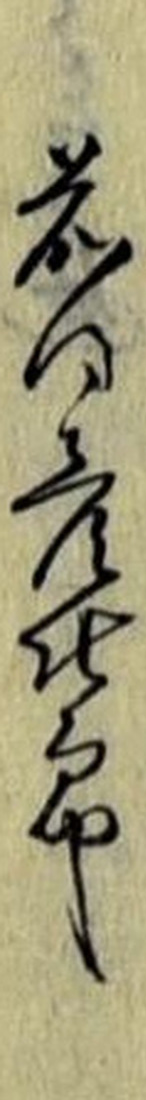前田彦次郎
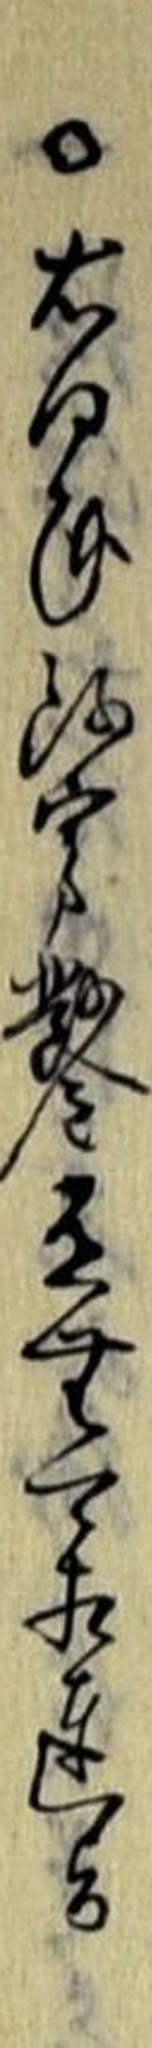〇右同趣致穿鑿有無可相達旨
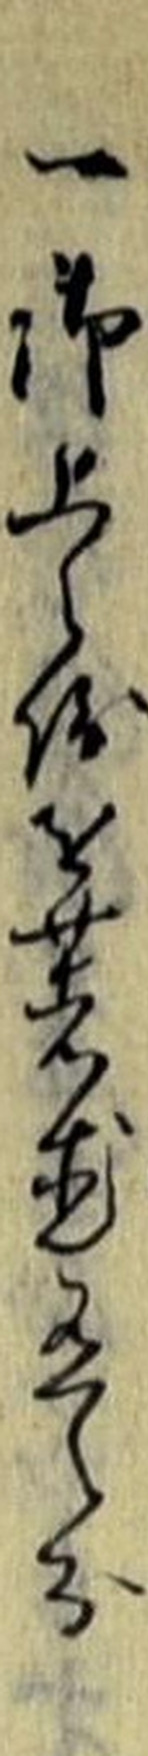一御上之儀を著述有之分
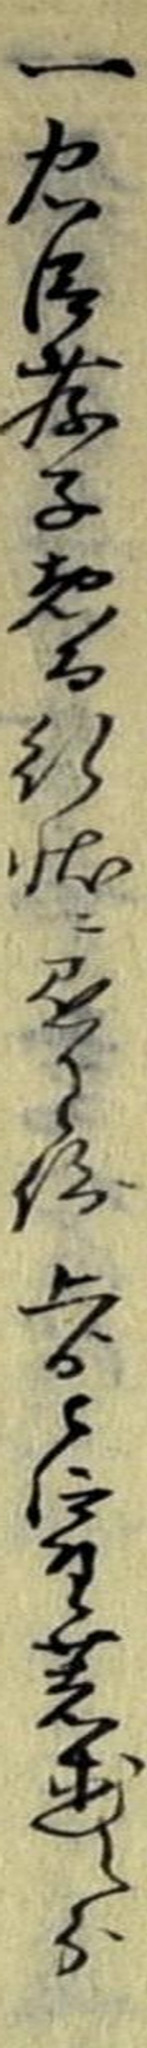一忠臣孝子惣而行状ニ懸り候儀上ゟ被仰付候著述之分
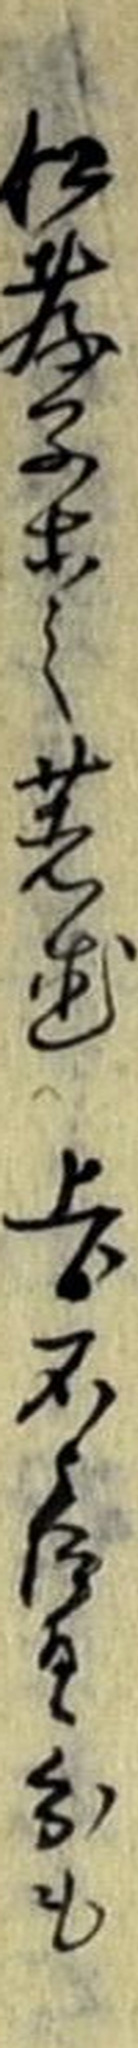但孝子等之著述上ゟ不被仰付候分も
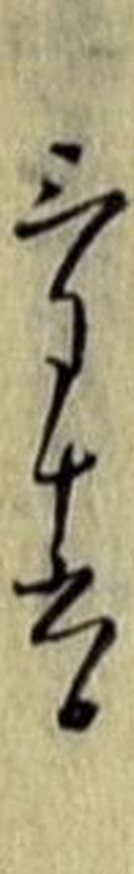三月十六日
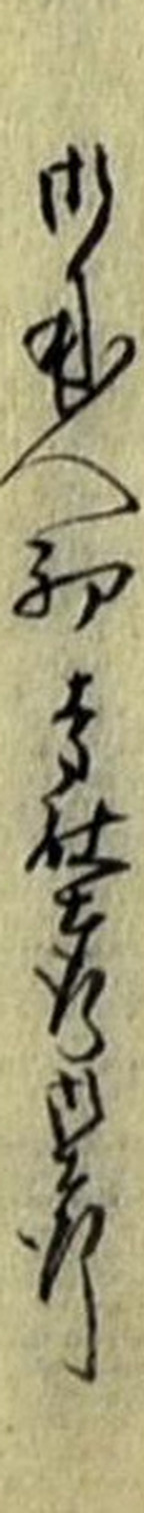御用人初寺社奉行御奉行
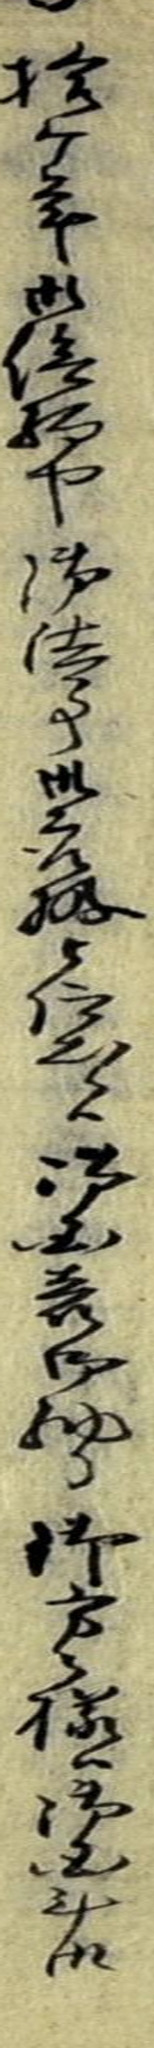〇拾ケ年御倹約中御法事御取扱被仰出候ハ御国表御納り御方々様ハ御国斗御
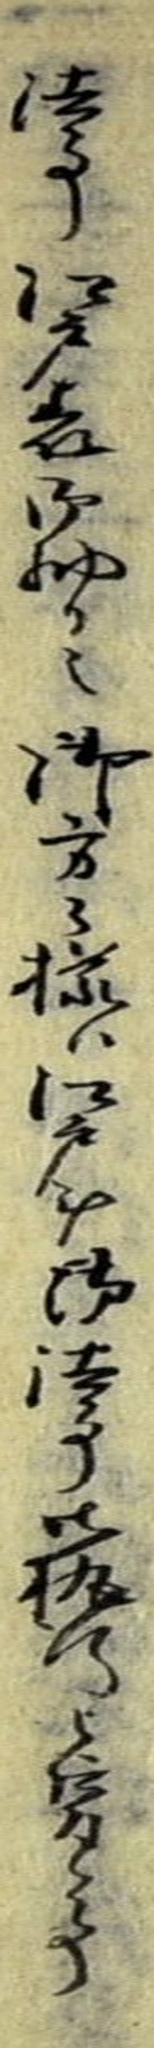法事江戸表御納り之御方々様ハ江戸斗御法事御執行被仰付候事
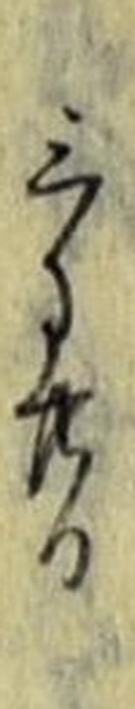三月廿日

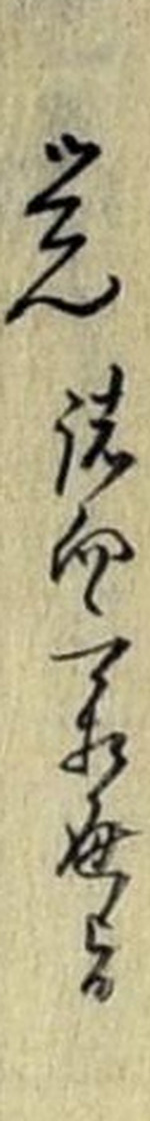覚諸向へ可相通旨
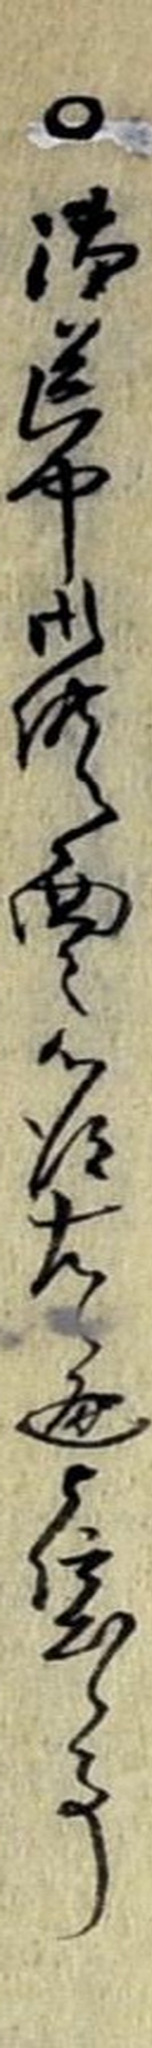〇御道中御供之面々心得左之通被仰出候事
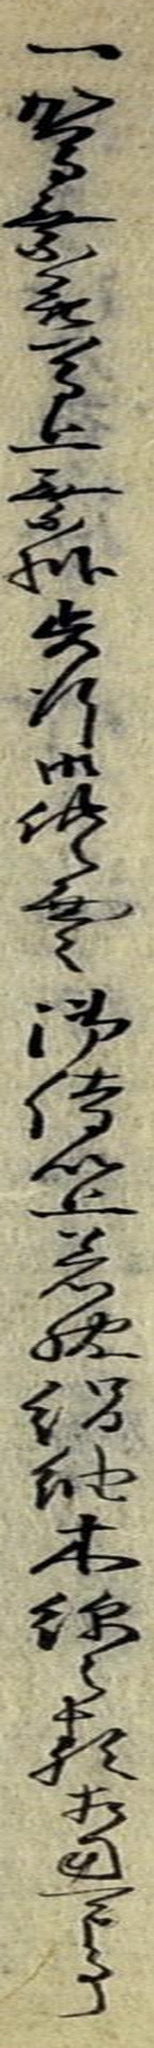一駕乗并馬上乗掛歩行御供之面々御侍以上着服絹紬木綿之類相用可申事
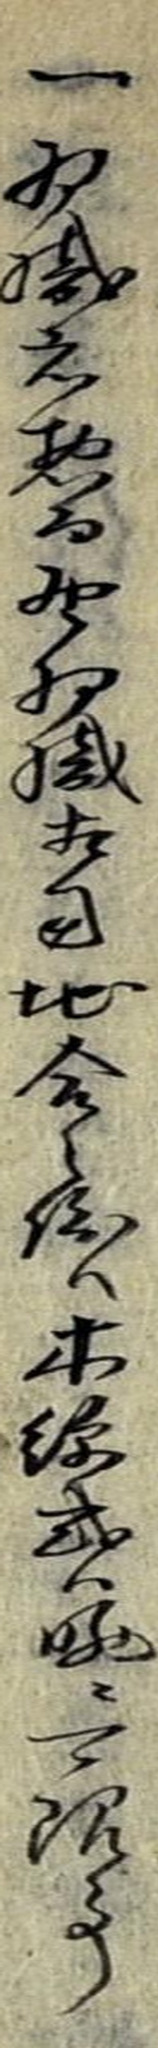一羽織者惣而野羽織相用地合之儀ハ木綿或ハ晒ニ可限事
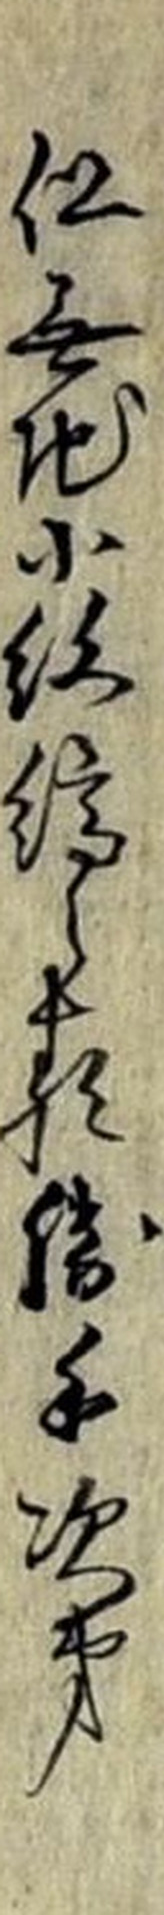但無地小紋縞之類勝手次第可申事
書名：命令之部 三
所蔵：福井県文書館 Fukui Prefectural Archives
